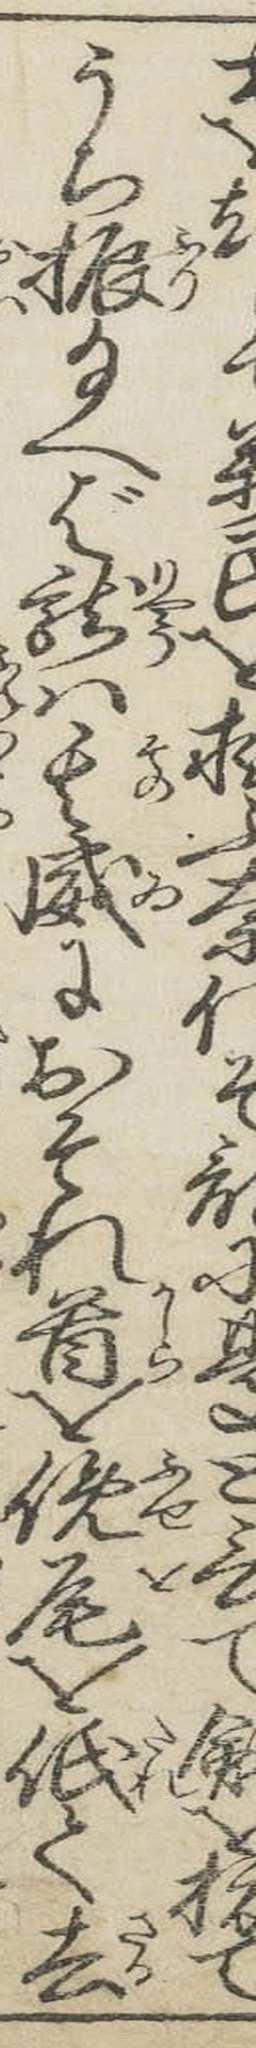うち振給へば竜は其威におそれ首を俛尾を低て去
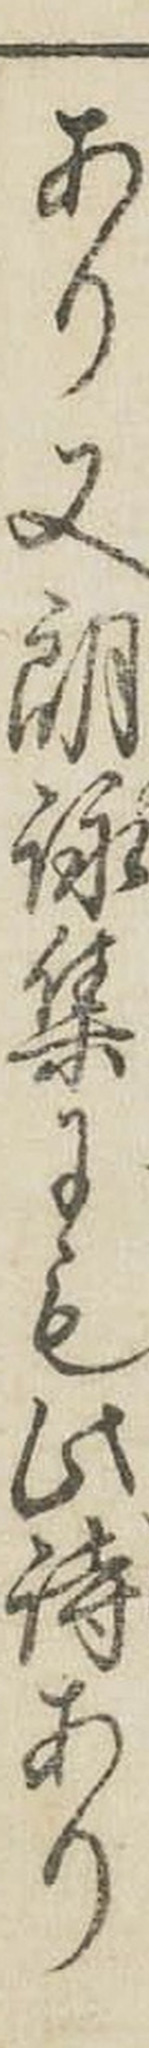あり又朗詠集にも此詩あり
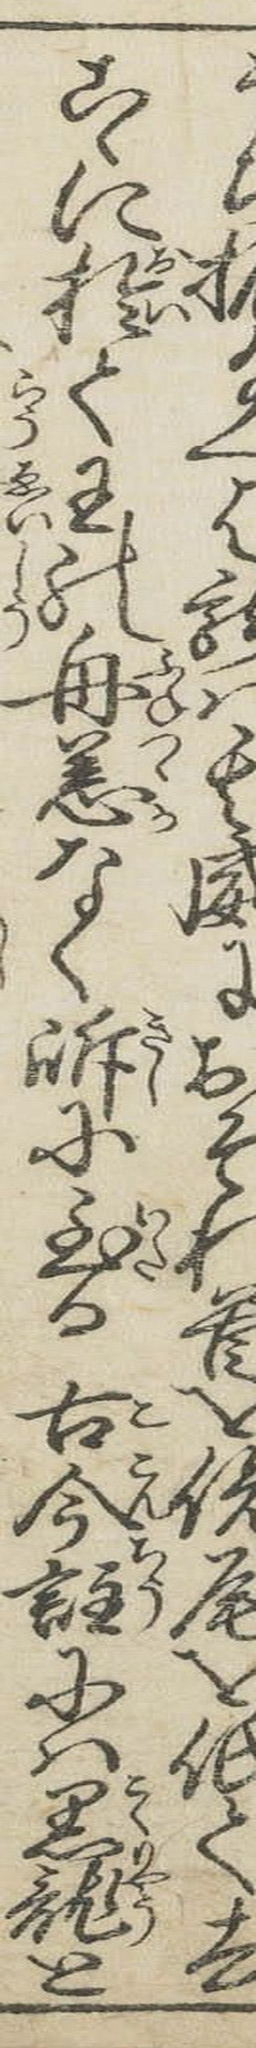こゝに於て王の舟恙なく岸に至る古今註には黒竜と

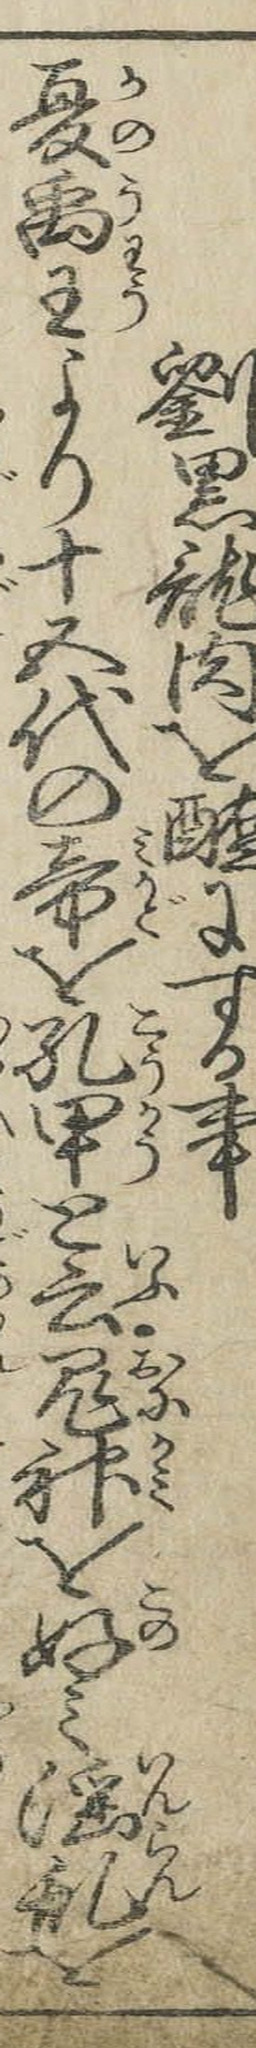夏禹王より十五代の帝孔甲と云。鬼神を好み淫乱を
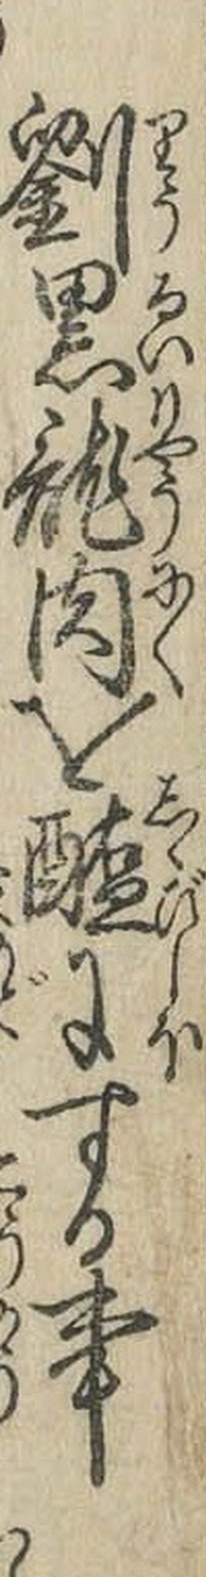劉類竜肉を醢にする事
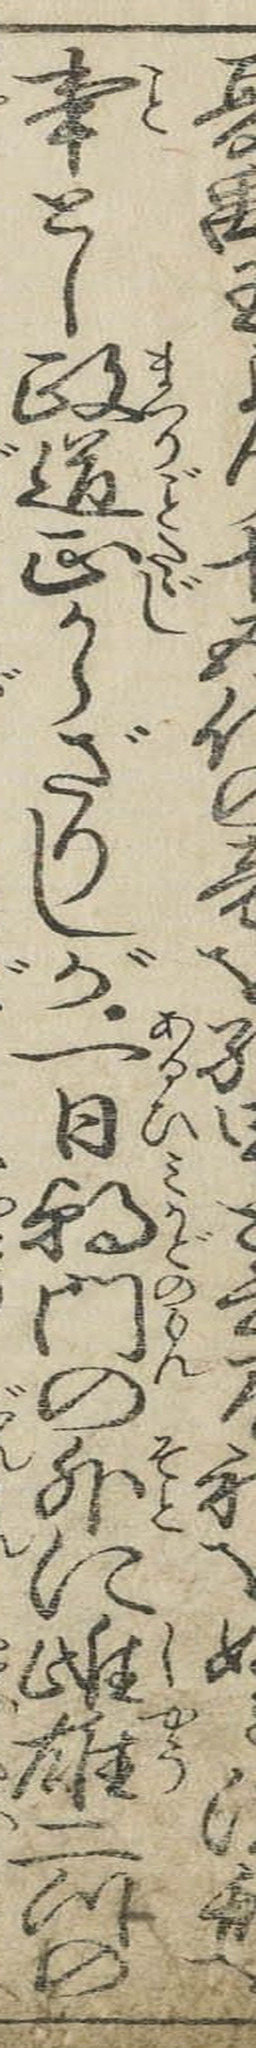事とし政道正からざりしが。一日朝門の外に雌雄二つの
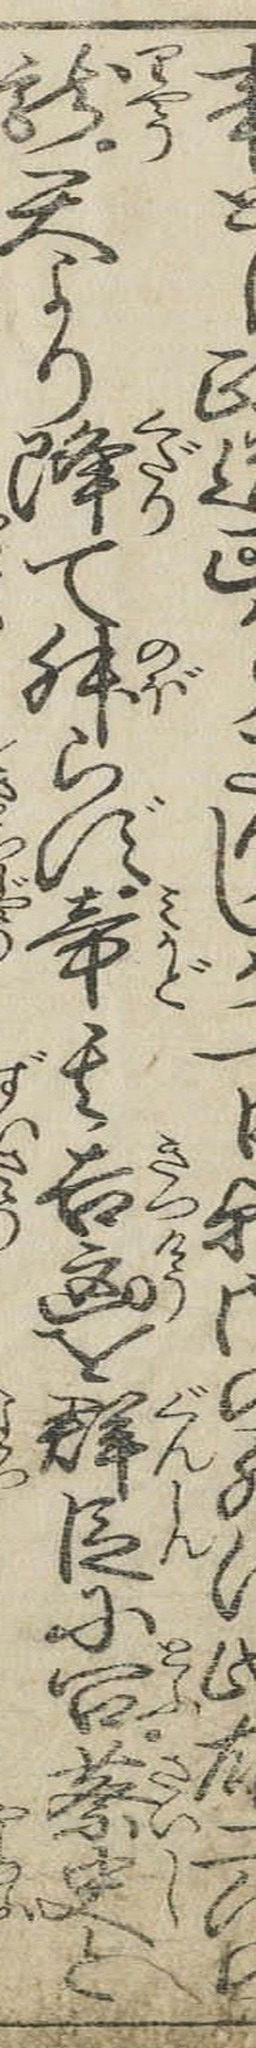竜。天より降て升らず。帝其吉凶を群臣に問。蔡史と
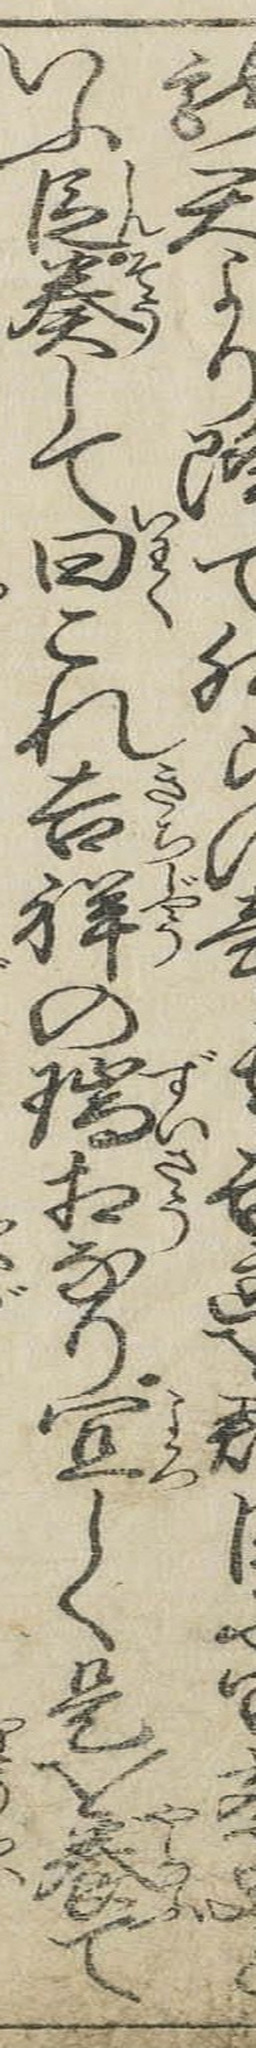いふ臣。奏して曰これ吉祥の瑞相なり。宜しく是を養て
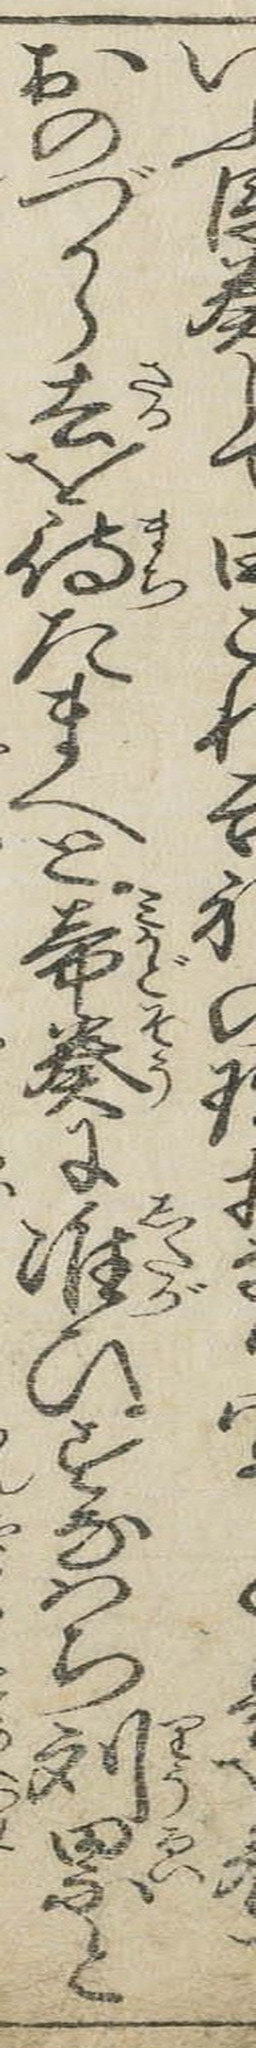おのづから去を待たまへと。帝奏に准ひ。すなはち劉類と
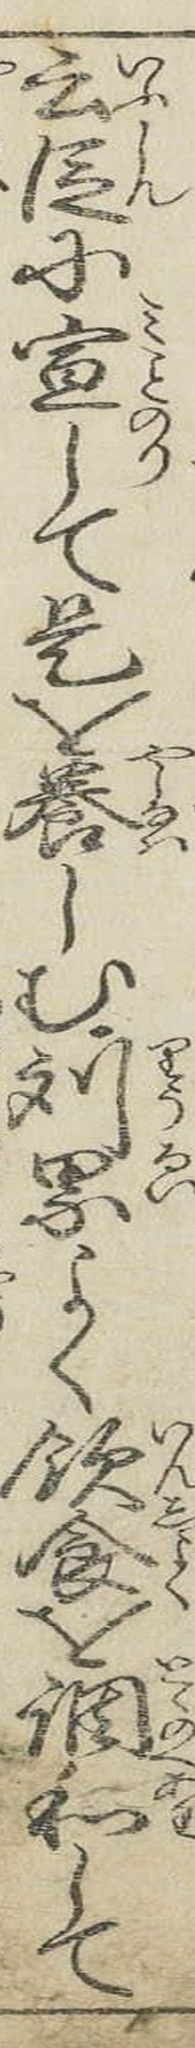云臣に宣して是を養しむ。劉類よく飲食を調和して
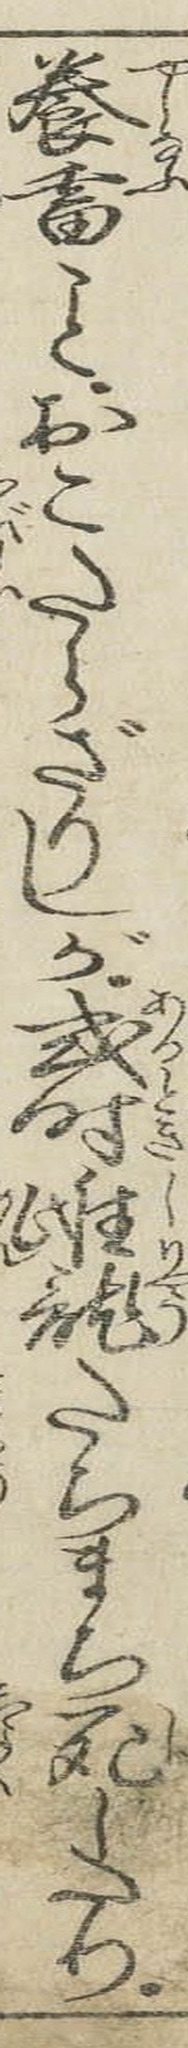養畜こと。おこたらざりしが。或時雌竜たちまち死したり。
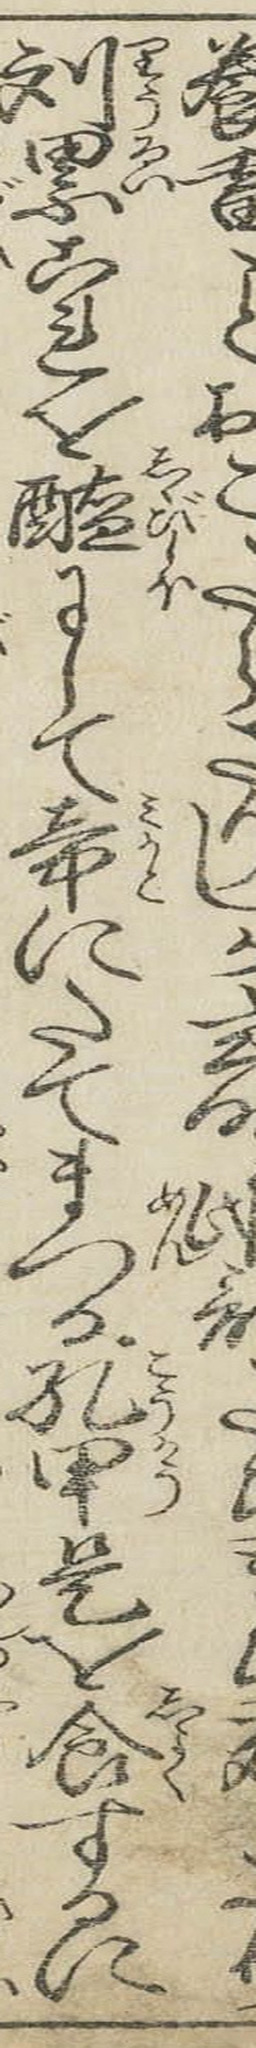劉類これを醢にして帝にたてまつる。孔甲是を食するに
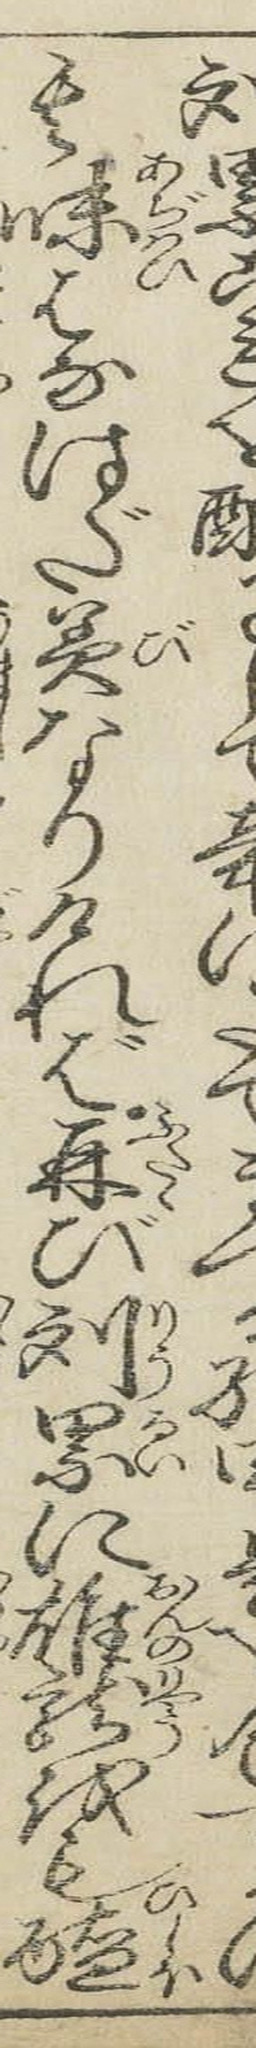其味はなはだ美なりければ。再び劉類に雄竜をも醢
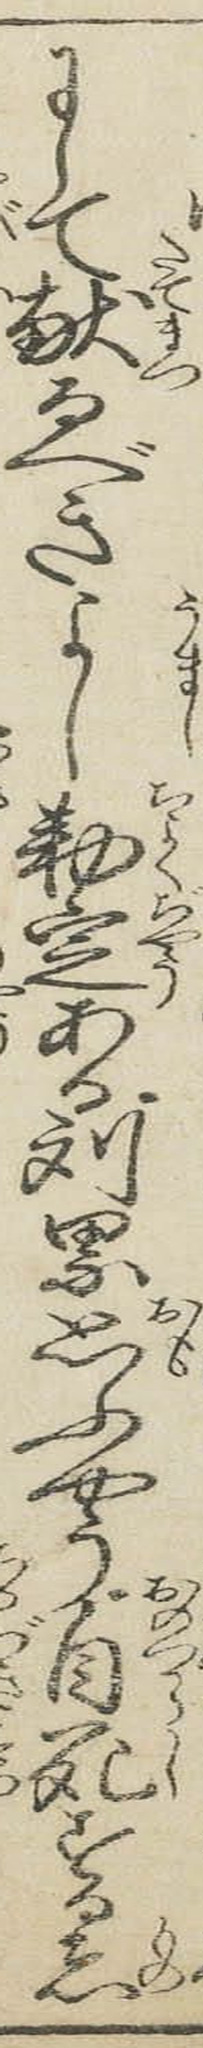にして献るべきよし勅定ある。劉類思ふやう。自死する者
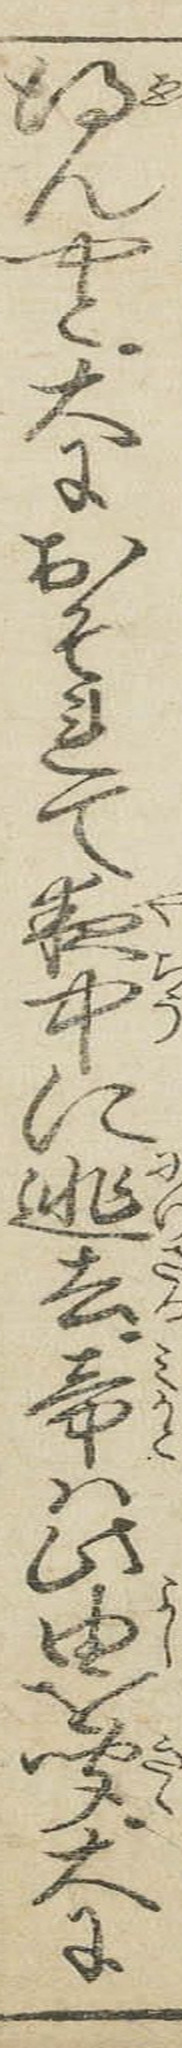得んやと。大におそれて夜中に逃去。帝は此由を聞。大に
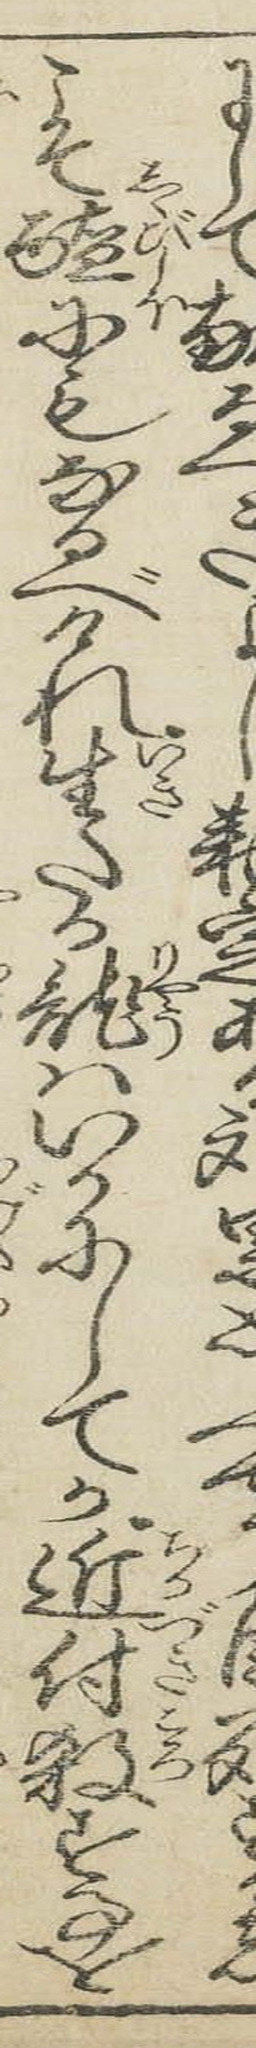こそ醢にもなるべけれ。生たる竜はいかにしてか。近付殺す事を
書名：絵本写宝袋 9巻 4之巻
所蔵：東京学芸大学教育コンテンツアーカイブ
